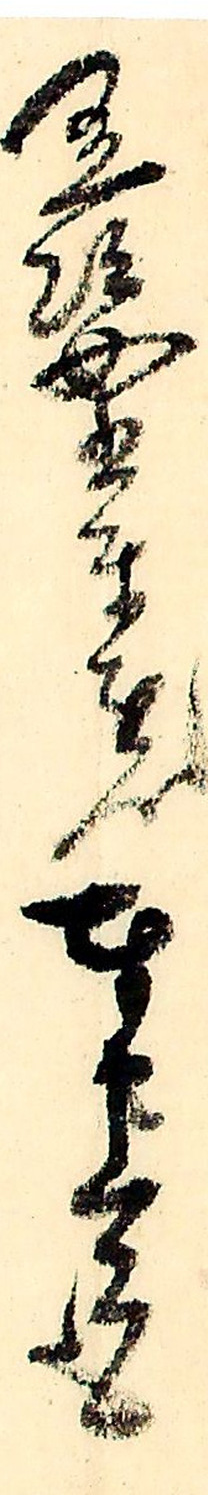有姿書付を以奉申上候以上
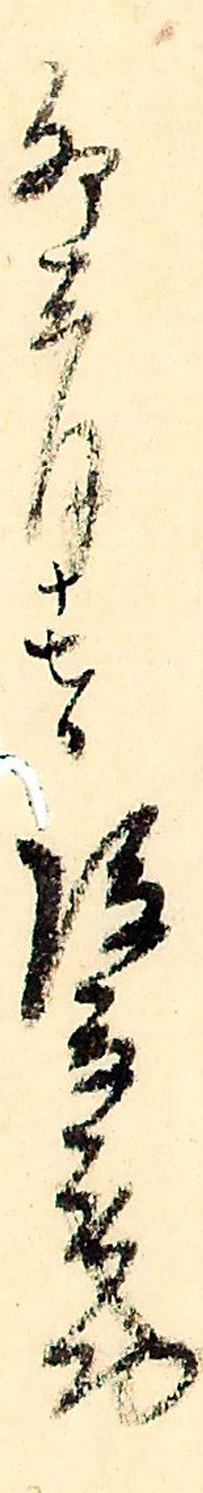卯十二月十七日後藤庄助

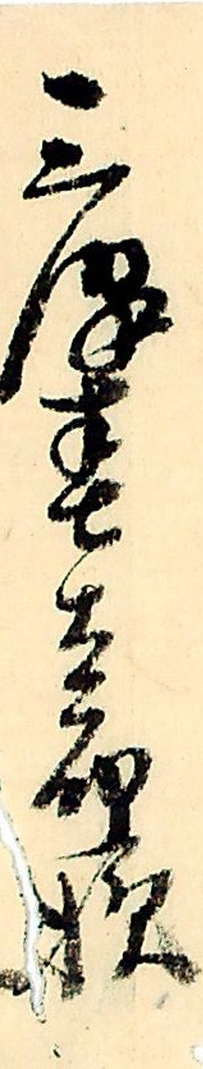三沢春太郎様
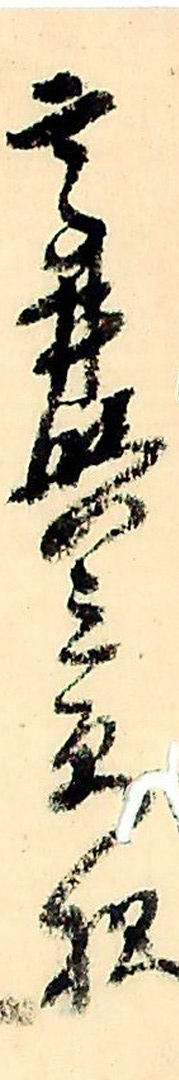高井与三兵衛様
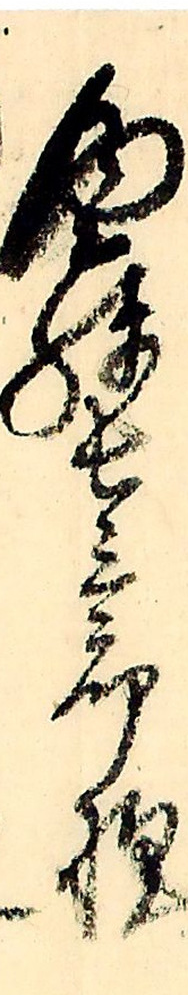内藤長三郎様
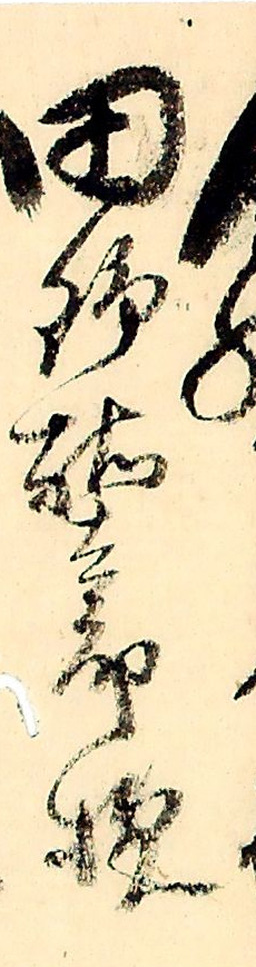田野祐太郎様
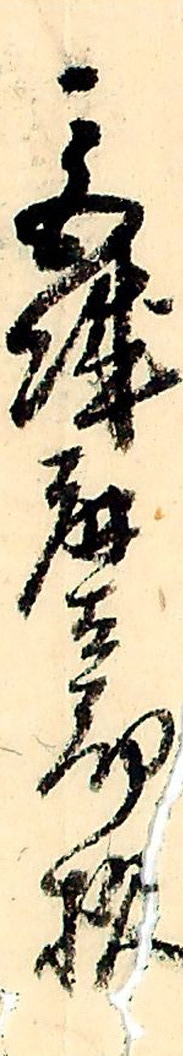宮城麻太郎様

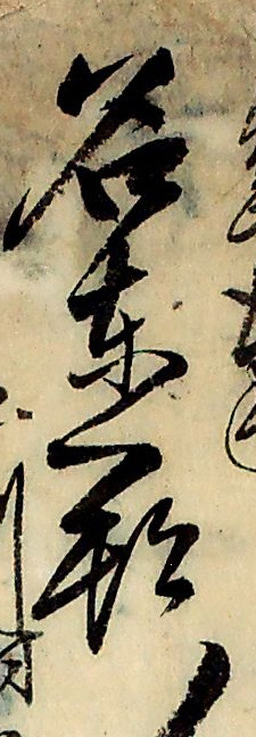名東郡
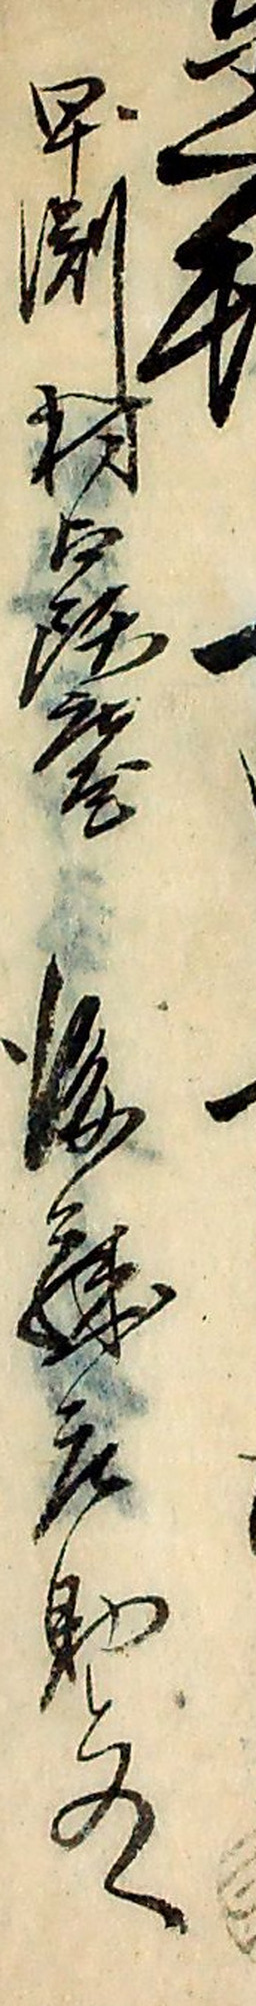早淵村与頭庄屋後藤庄助とのへ

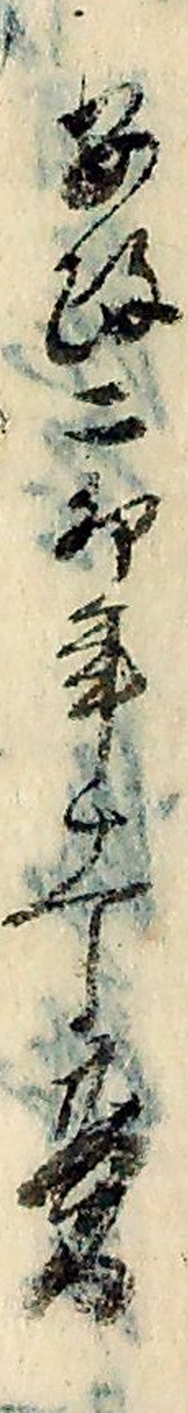安政二卯年十一月廿一日

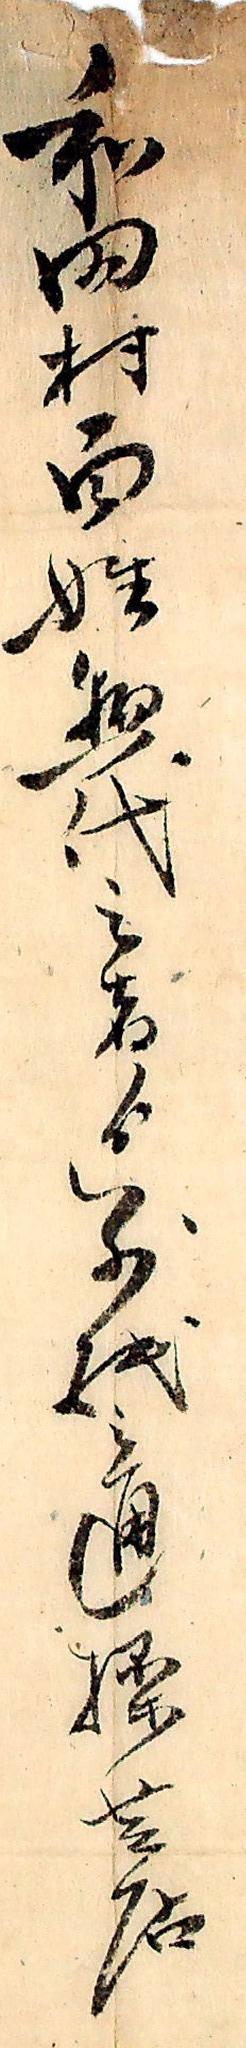和田村百姓惣代之者ゟ別紙之通操芝居
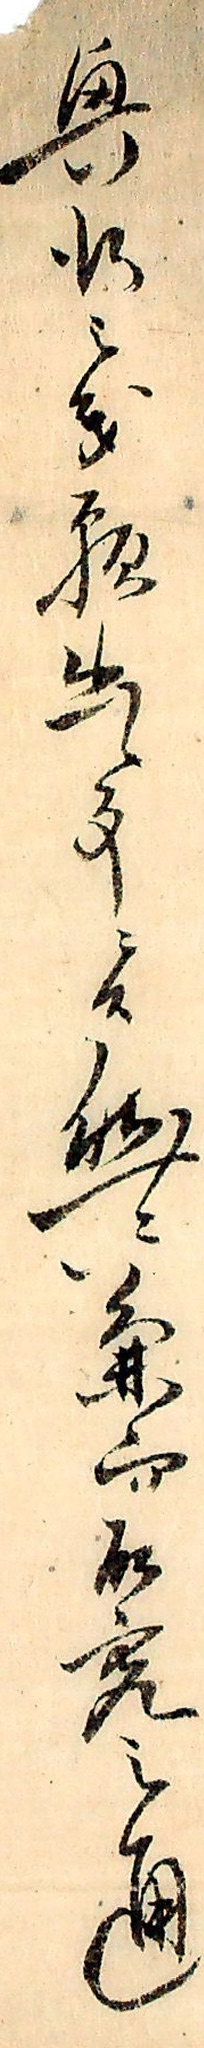興行之義願出候事に候然に兼て取究之通
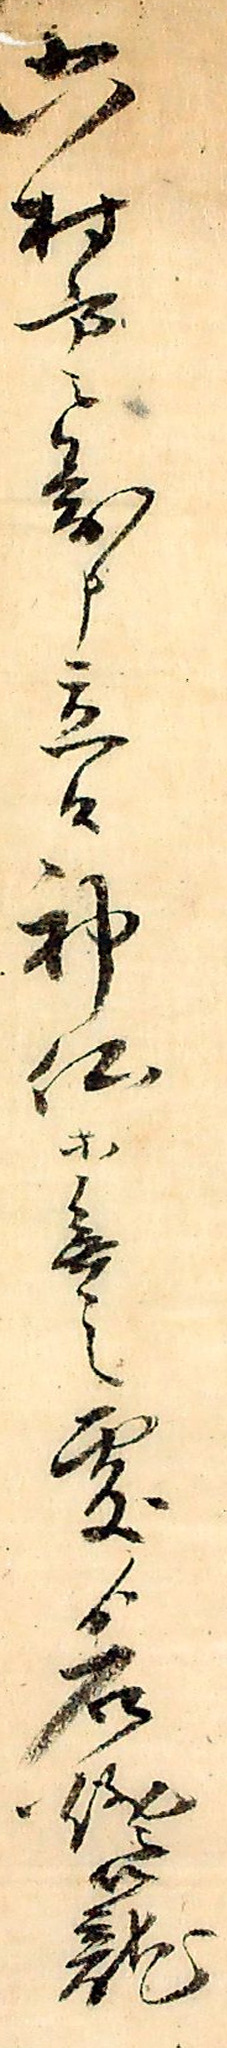右村方之義申立候神仏等無之処ゟ石灯籠
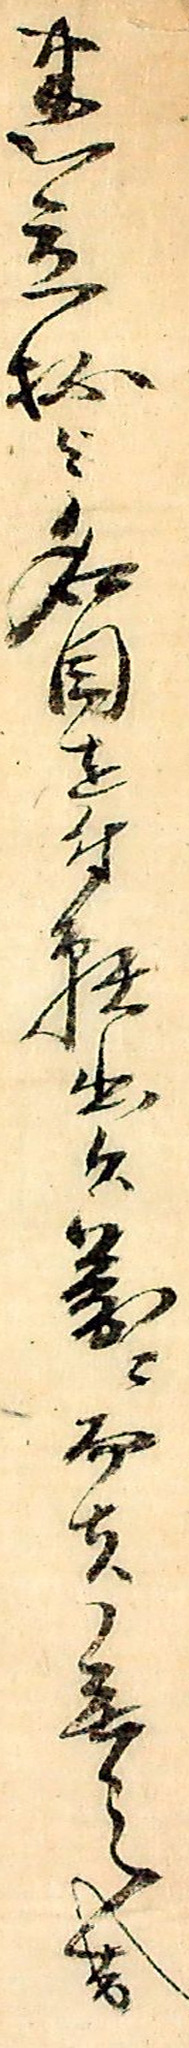建立抔と名目を付願出候義にては無之哉
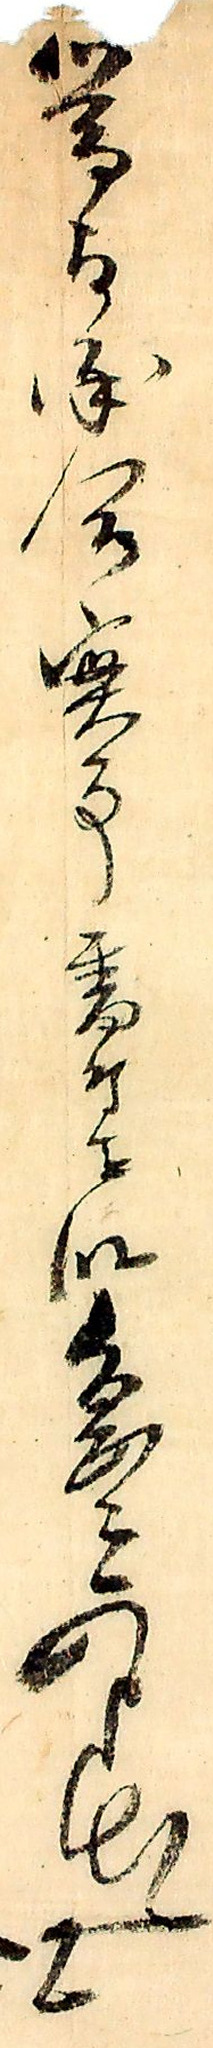篤と承合実事書付を以急々可申出候以上
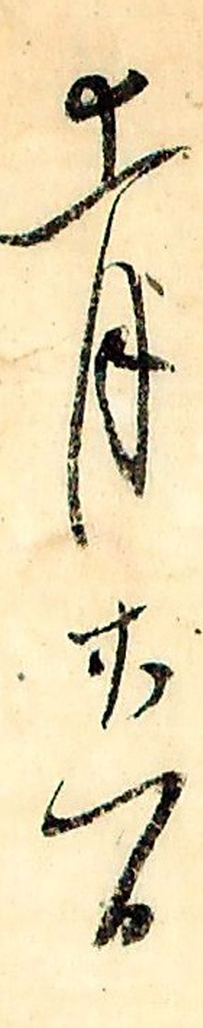十一月廿一日
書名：和田村操芝居不合書控
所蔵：鳴門教育大学 Naruto University of Education
